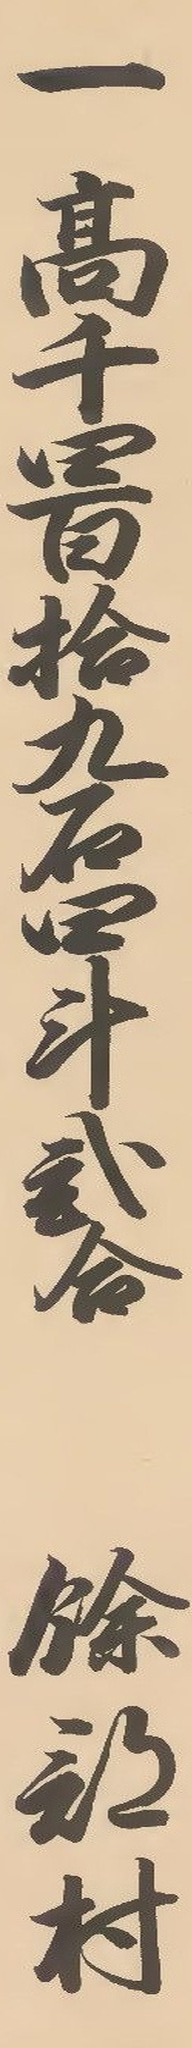一高千四百拾九石四斗弐合余部村
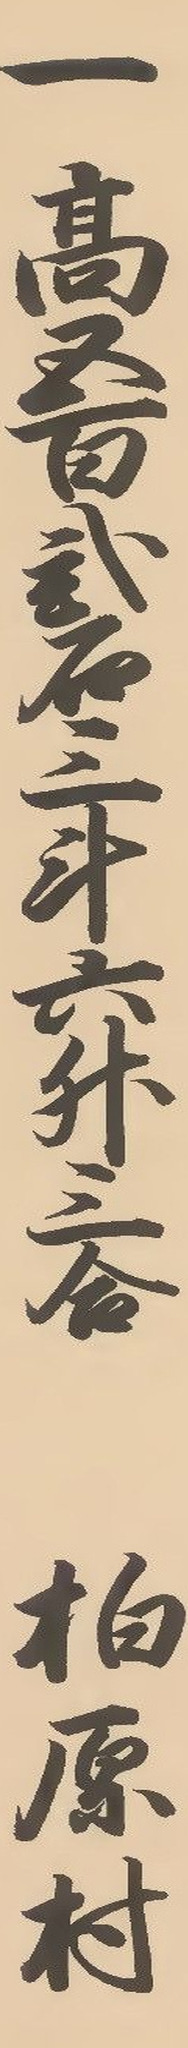一高五百弐石三斗六升三合柏原村
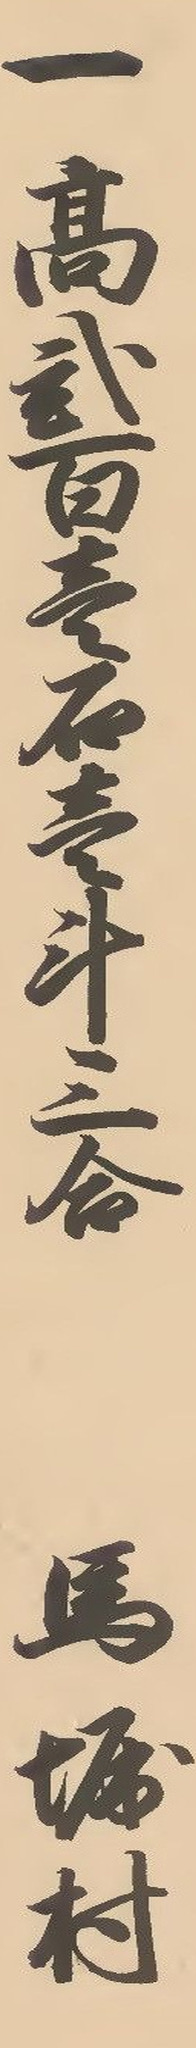一高弐百壱石壱斗三合馬堀村

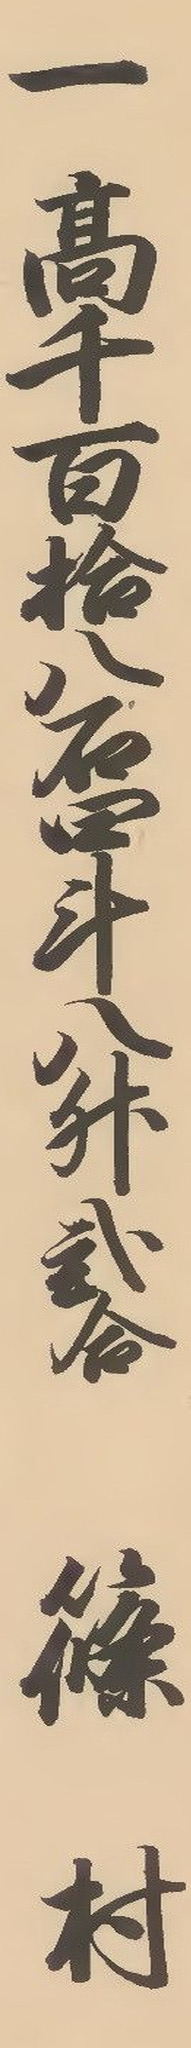一高千百拾八石四斗八升弐合篠村
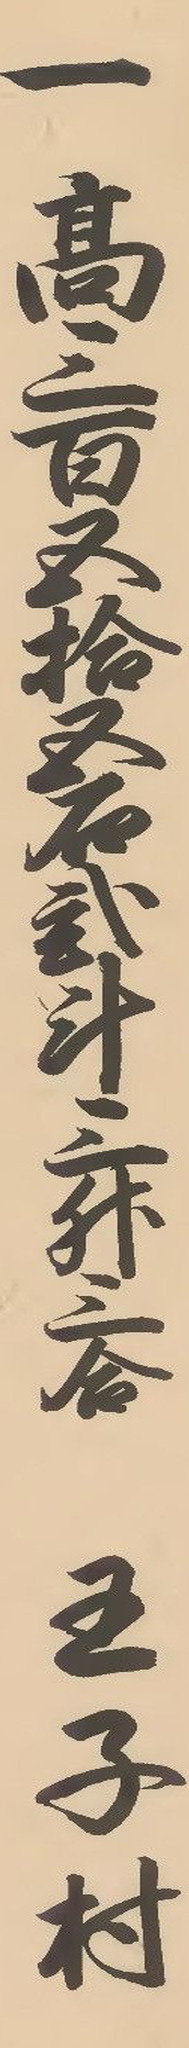一高三百五拾五石弐斗三升三合王子村
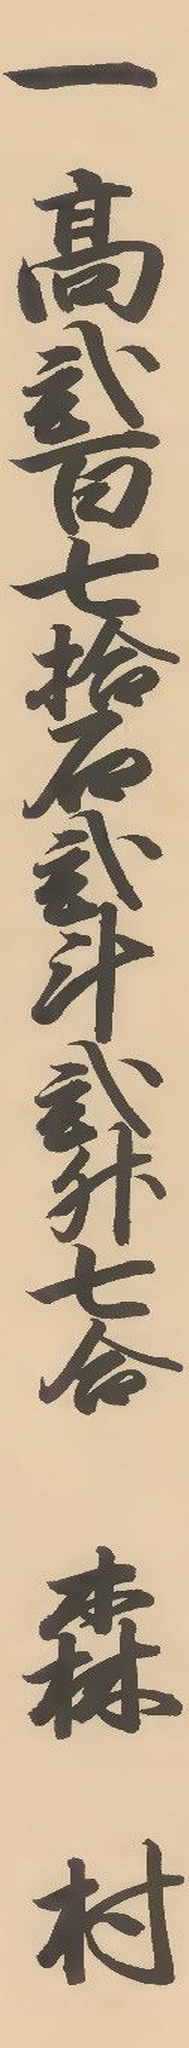一高弐百七拾石弐斗弐升七合森村
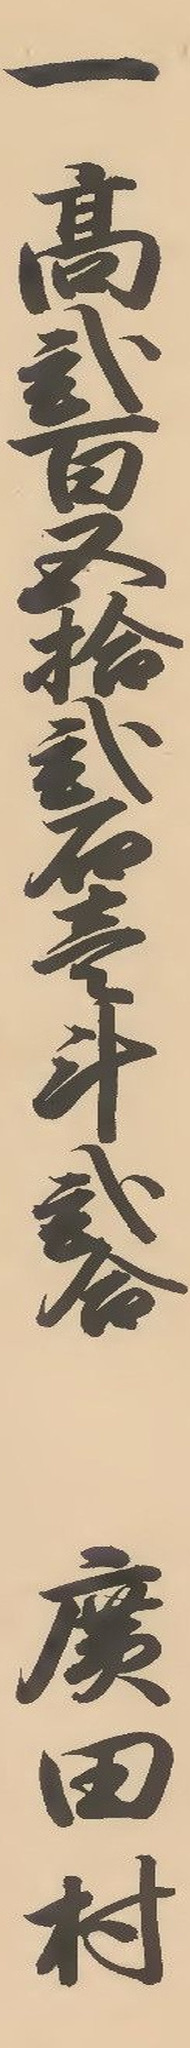一高弐百五拾弐石壱斗弐合広田村
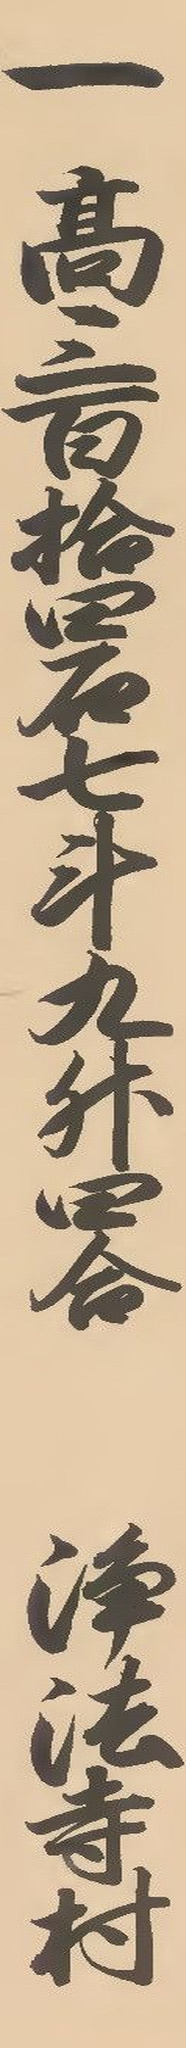一高三百拾四石七斗九升四合浄法寺村
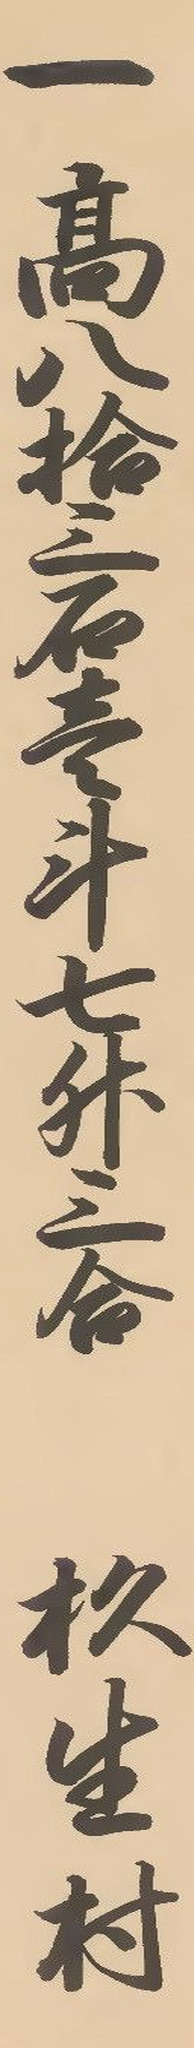一高八拾三石壱斗七升三合杉生村
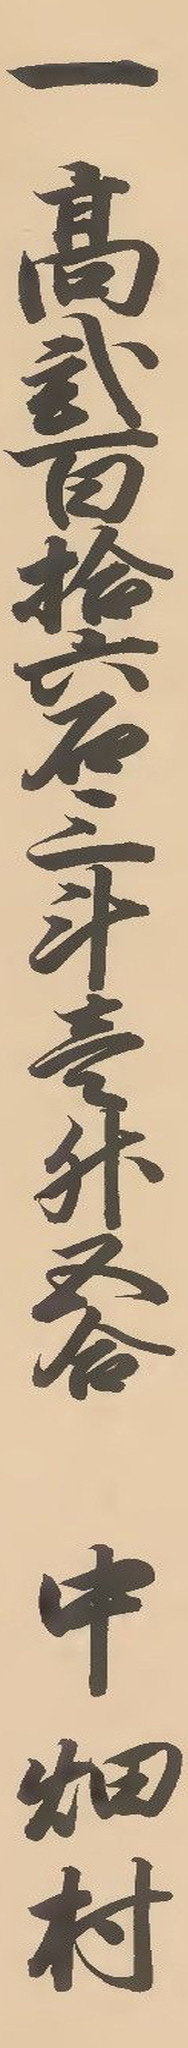一高弐百拾六石三斗壱升五合中畑村
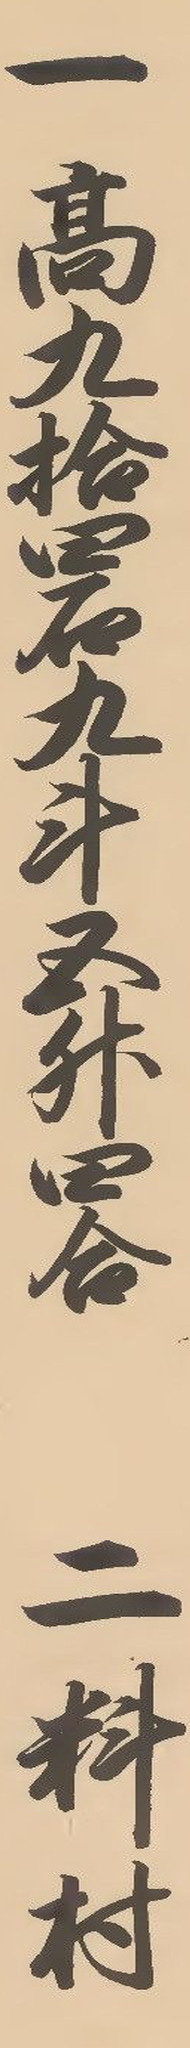一高九拾四石九斗五升四合二料村

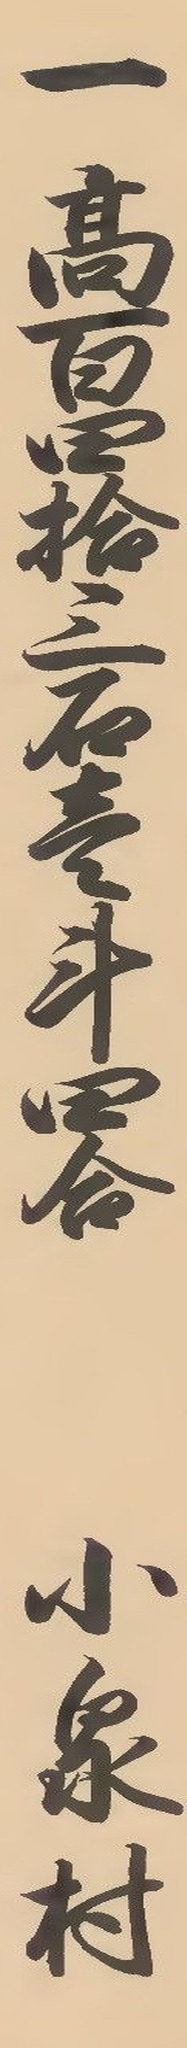一高百四拾三石壱斗四合小泉村
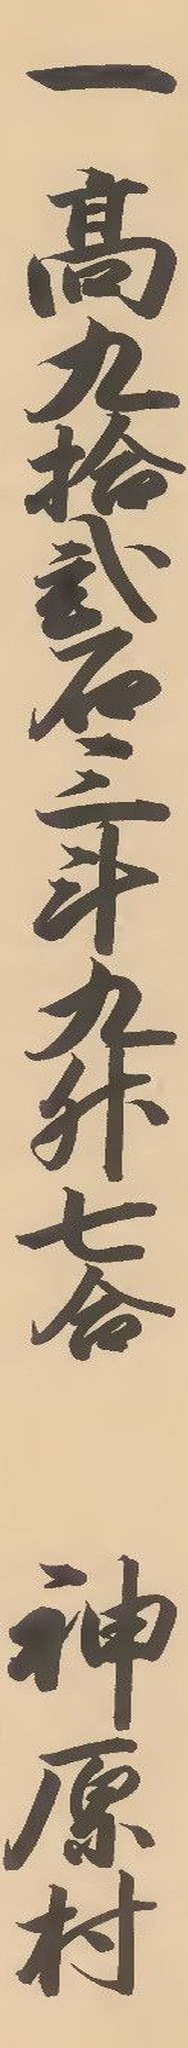一高九拾弐石三斗九升七合神原村
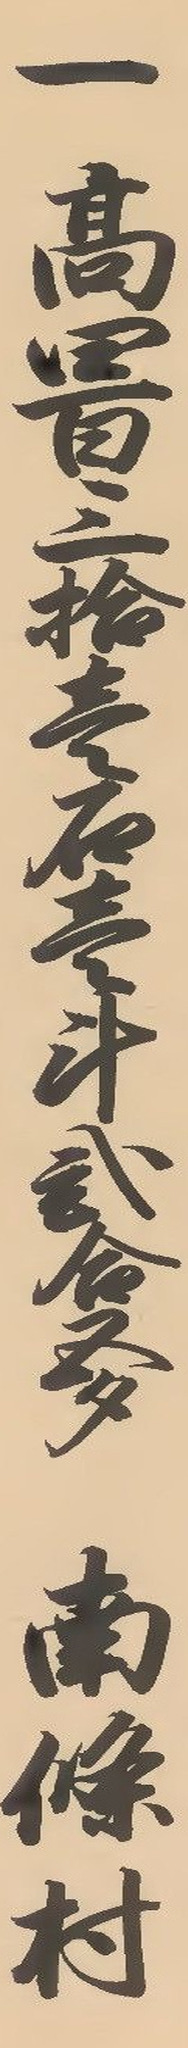一高四百三拾壱石壱斗弐合五勺南条村
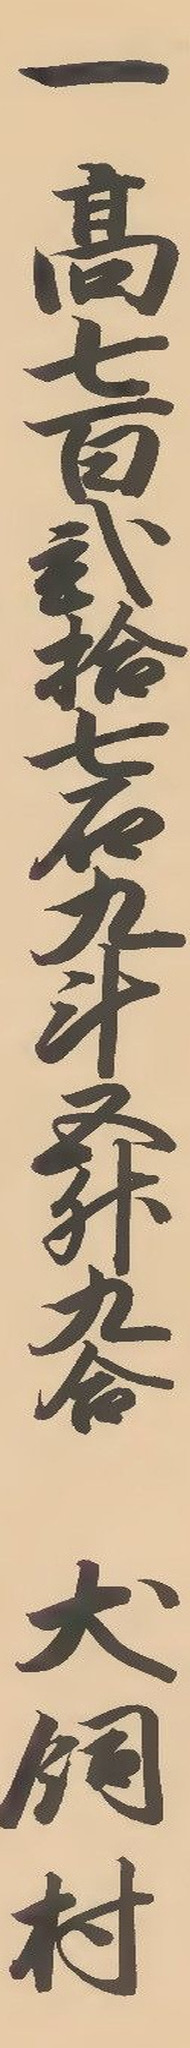一高七百弐拾七石九斗五升九合犬飼村
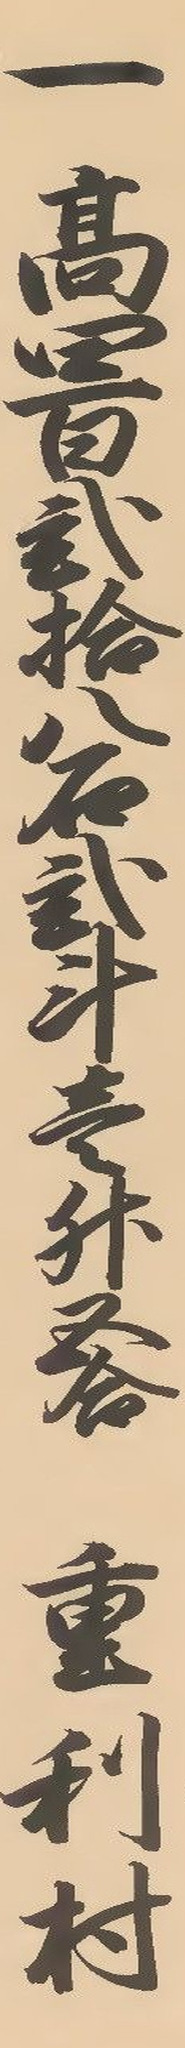一高四百弐拾八石弐斗壱升五合重利村
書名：丹波国郷帳
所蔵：国立公文書館 National Archives of Japan
